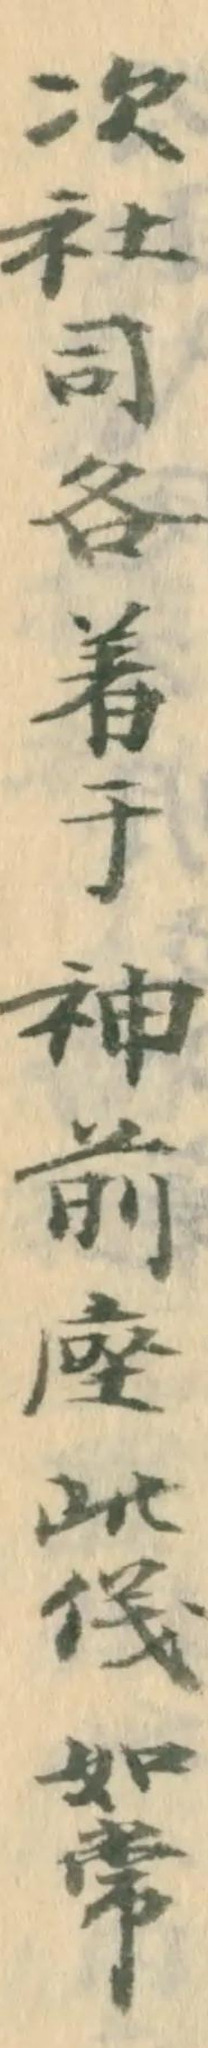次社司各着于神前座此儀如常

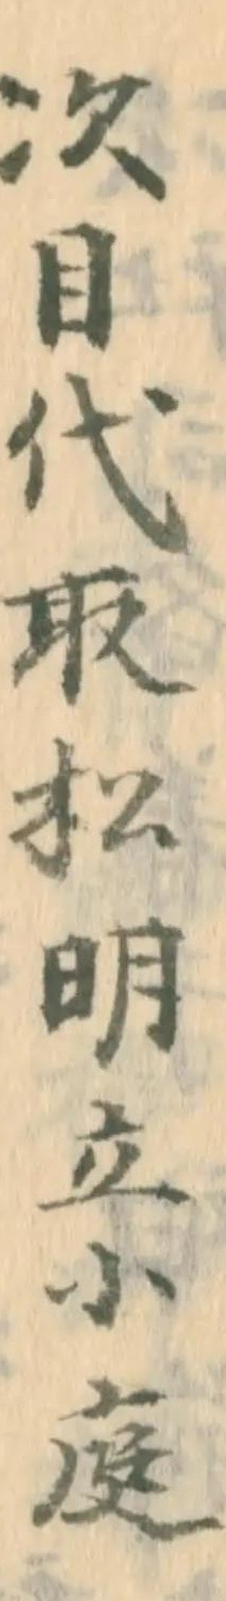次目代取松明立小庭
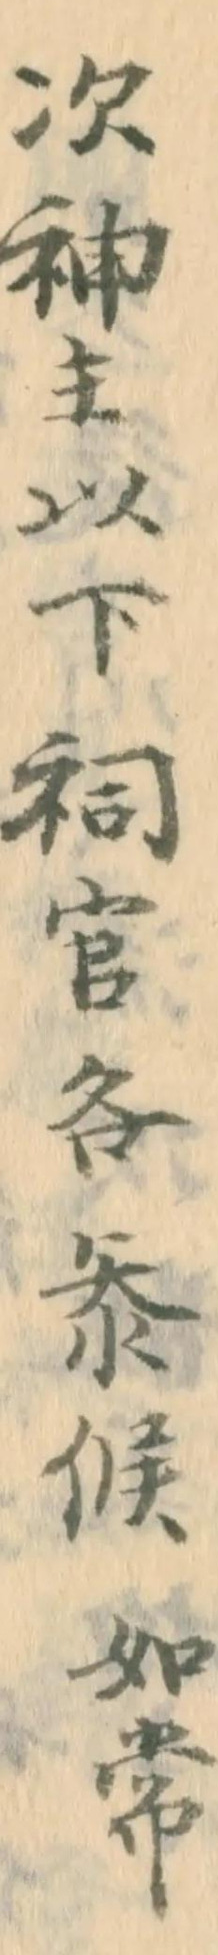次神主以下祠官各参候如常
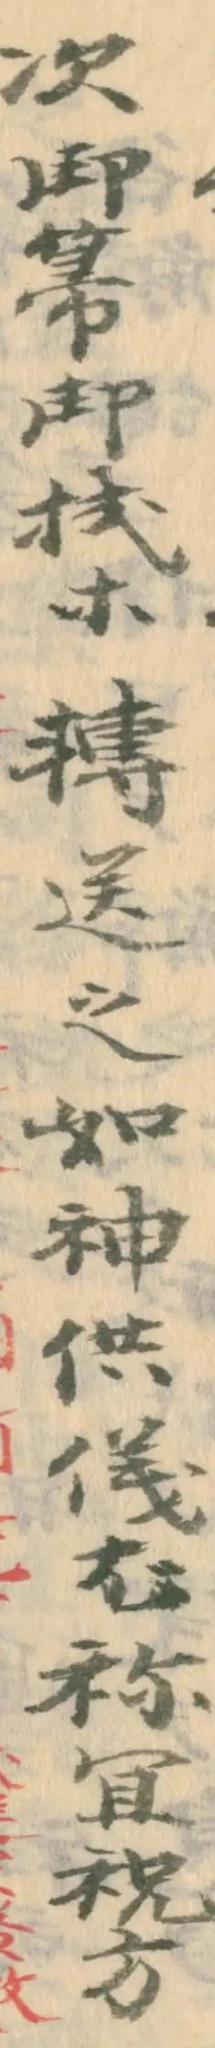次御箒御拭等転送之如神供儀尤禰宜祝方
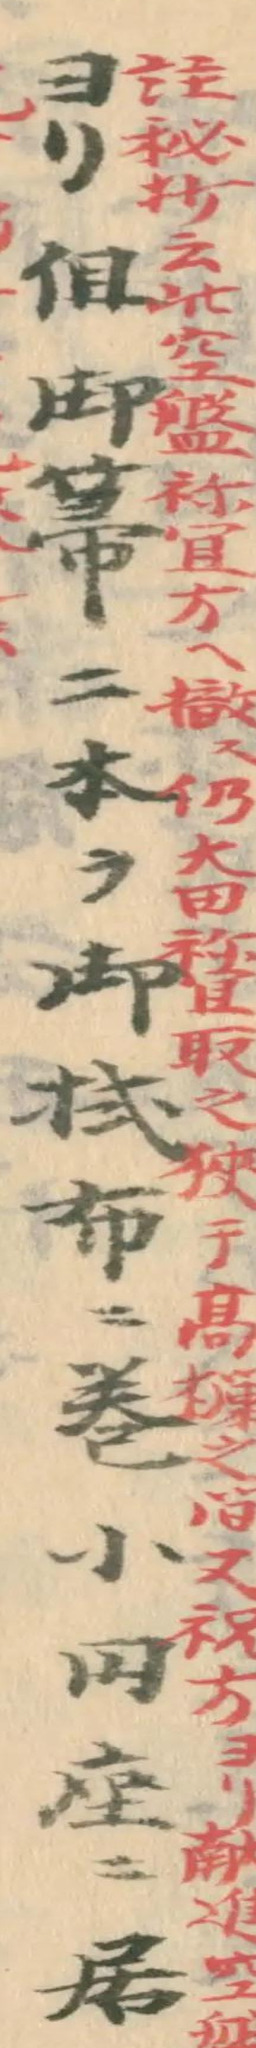ヨリ但御箒ニ本ヲ御拭布ニ巻小円座ニ居
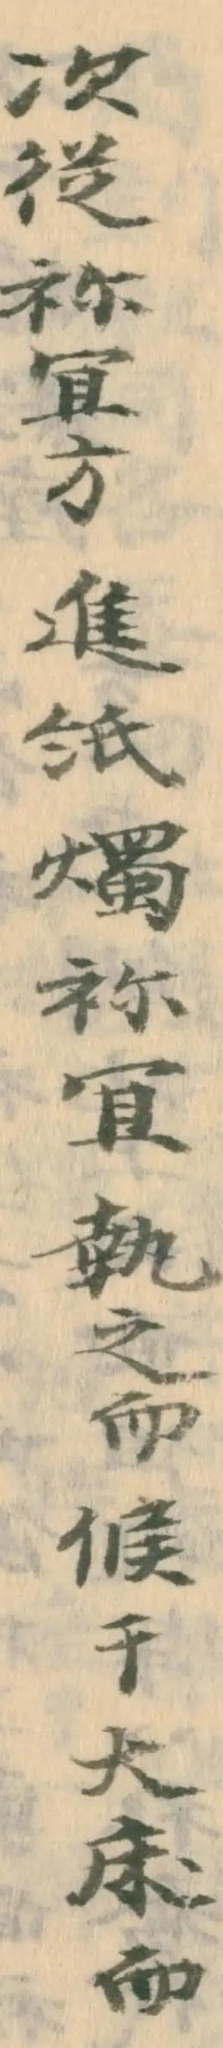次従禰宜方進紙燭禰宜執之而候于大床而
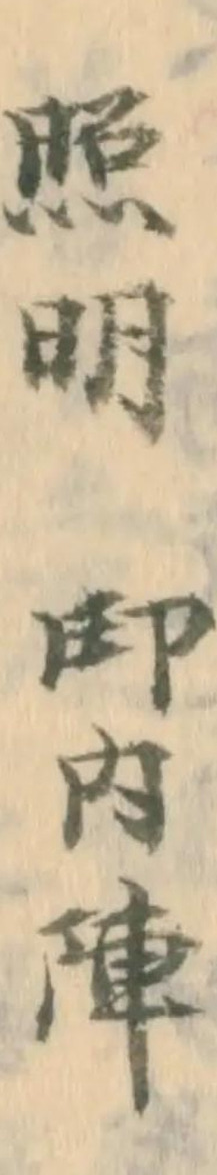照明御内陣
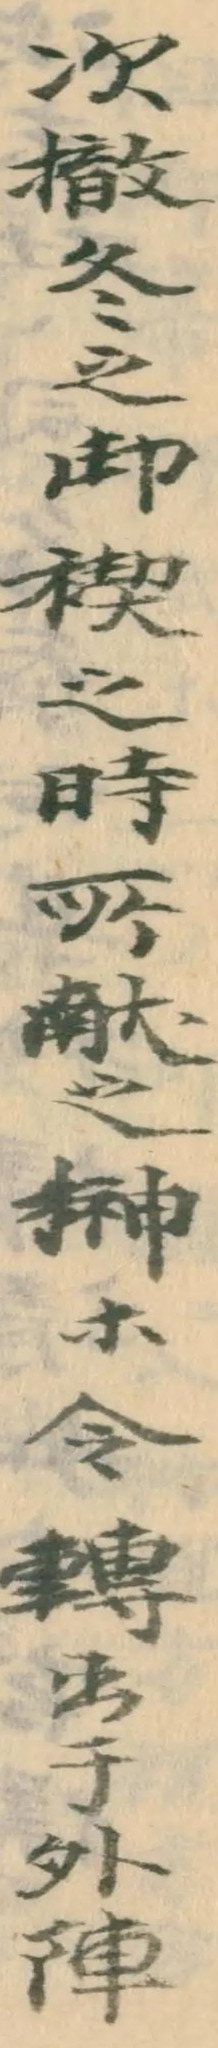次撤冬之御禊之時所献之榊等令転出于外陣
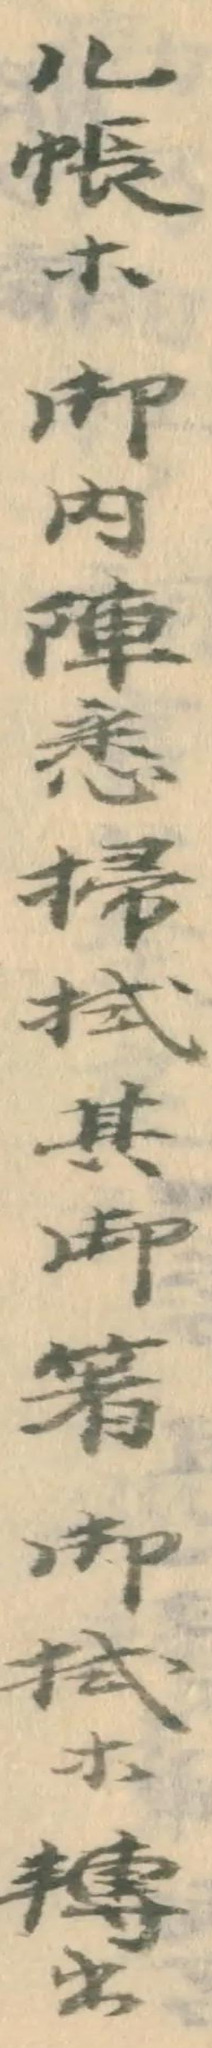凡帳等御内陣悉掃拭其御箸御拭等転出
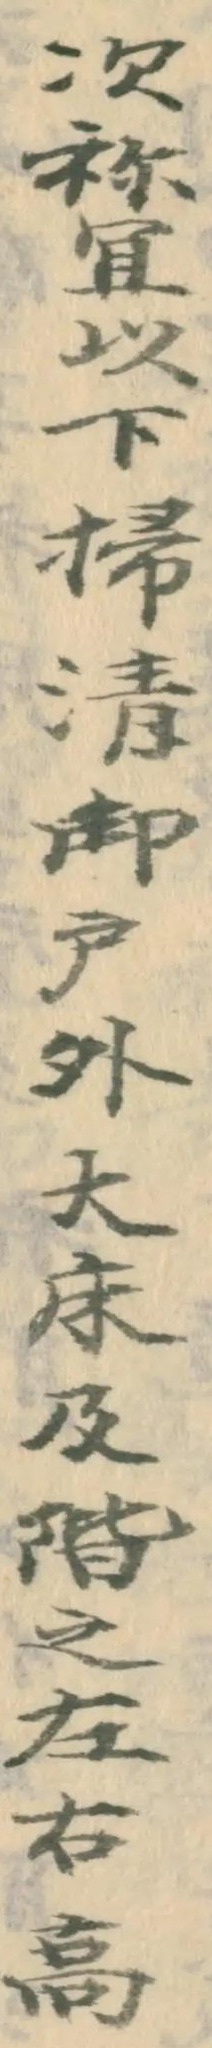次禰宜以下掃清御戸外大床及階之左右高
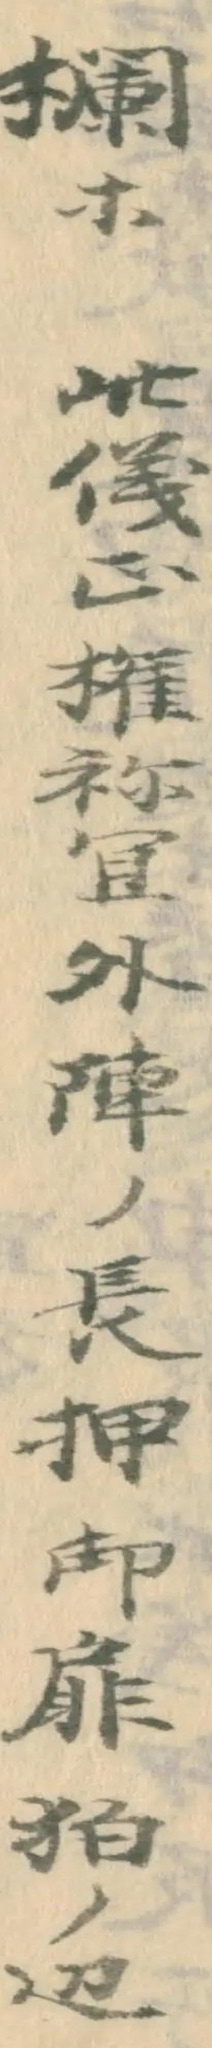欄等此儀正権禰宜外陣ノ長押御扉狛ノ辺
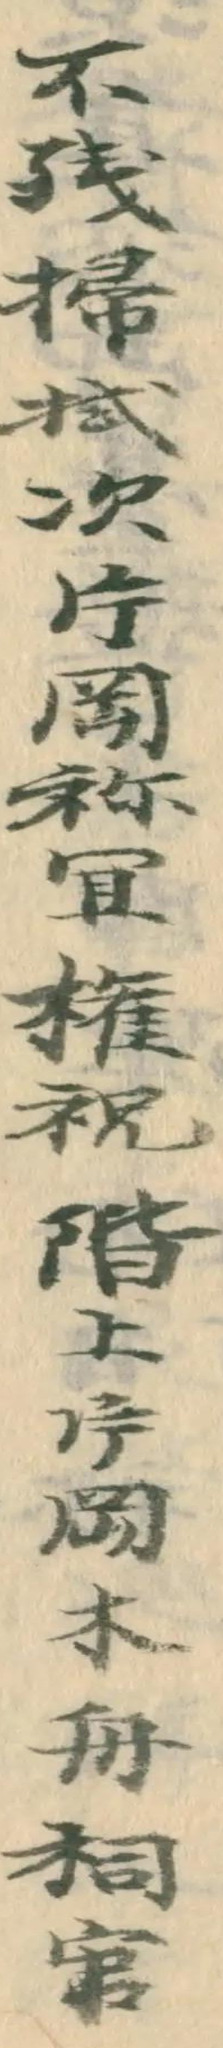不残掃拭次片岡禰宜権祝階上片岡木舟祠官
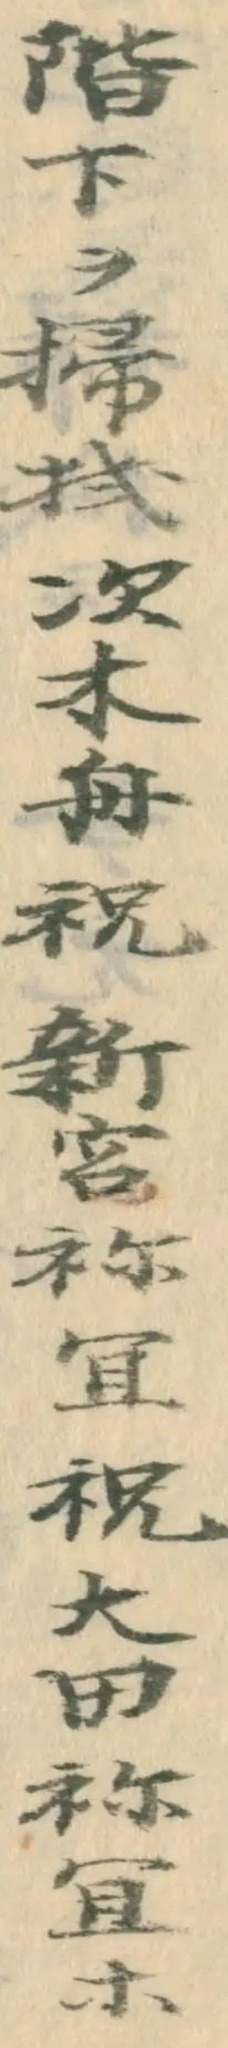階下ヲ掃拭次木舟祝新宮禰宜祝大田禰宜等
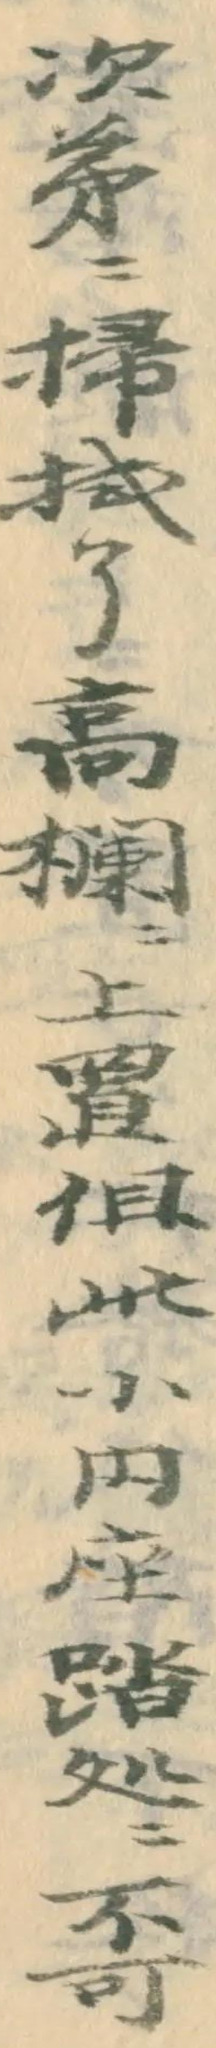次第ニ帰拭了高欄ニ上置但此小円座踏処ニ不可

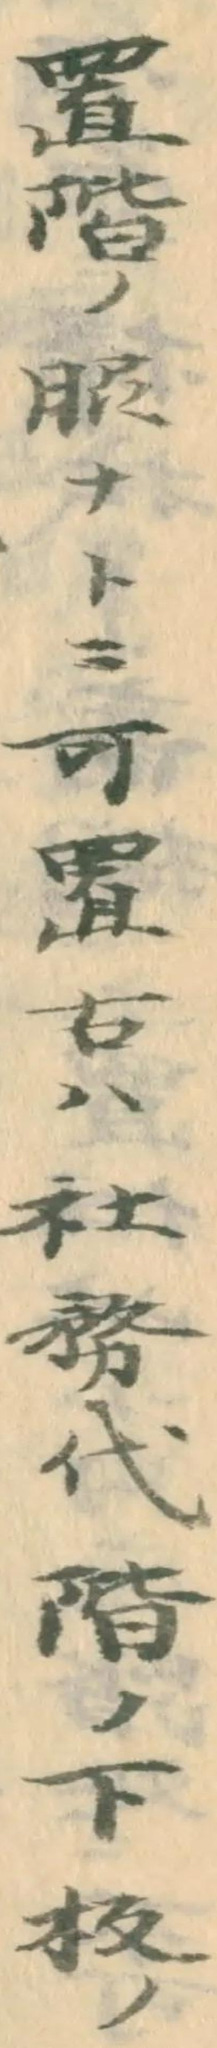置階ノ脇ナトニ可置古ハ社務代階ノ下板ノ
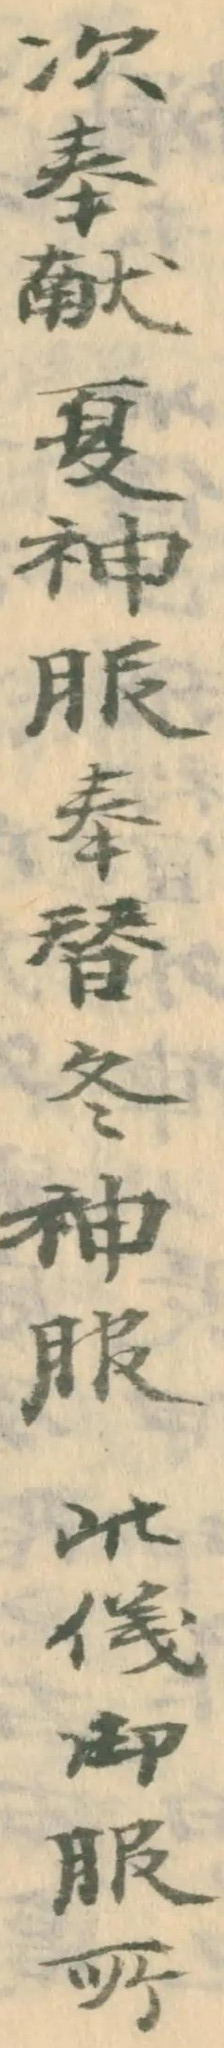次奉献夏神服奉替冬神服此儀御服所
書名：賀茂社記録. 第5冊
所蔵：国立国会図書館 National Diet Library, JAPAN
